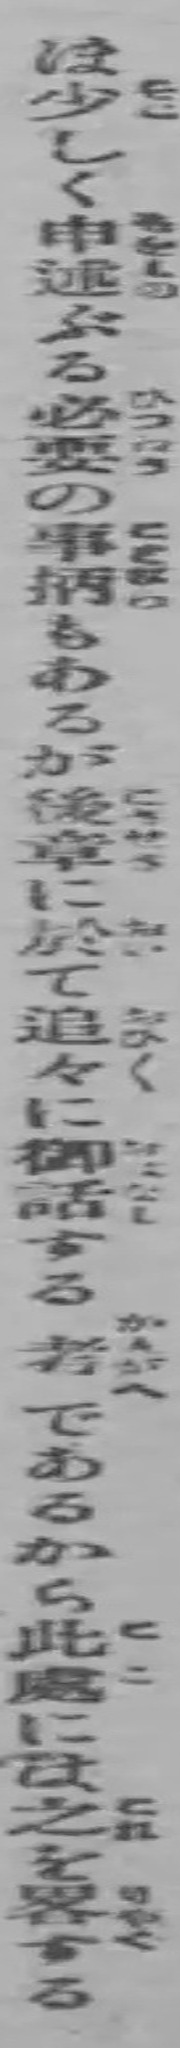ほ少しく申述ぶる必要の事柄もあるが後章に於て追々に御話する考であるから此処には之を略する
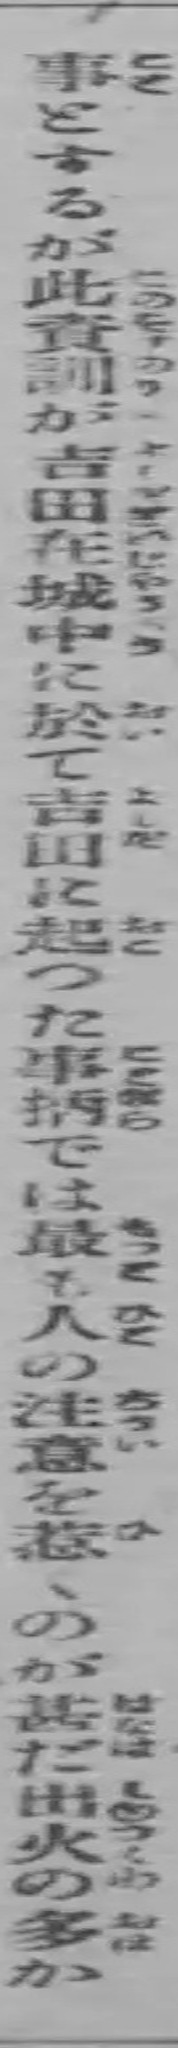出火頻々事とするが此資訓が吉田在城中に於て吉田に起つた事柄では最も人の注意を惹くのが甚だ出火の多か
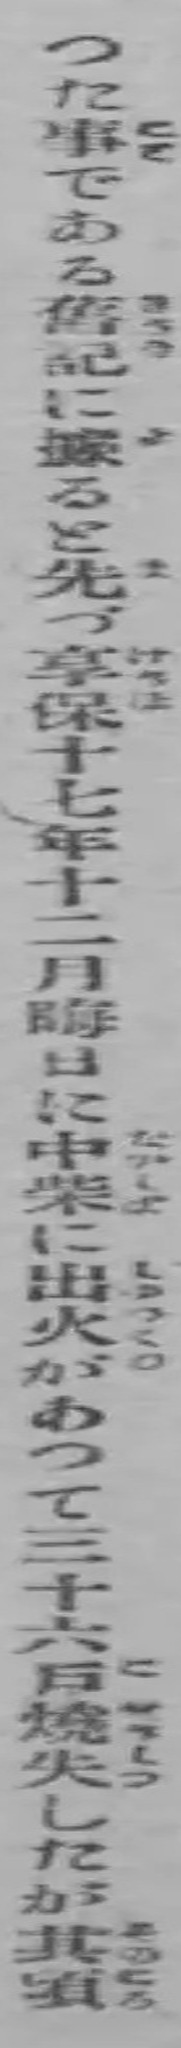つた事である旧記に拠ると先づ享保十七年十二月晦日に中柴に出火があつて三十六戸焼失したが其頃
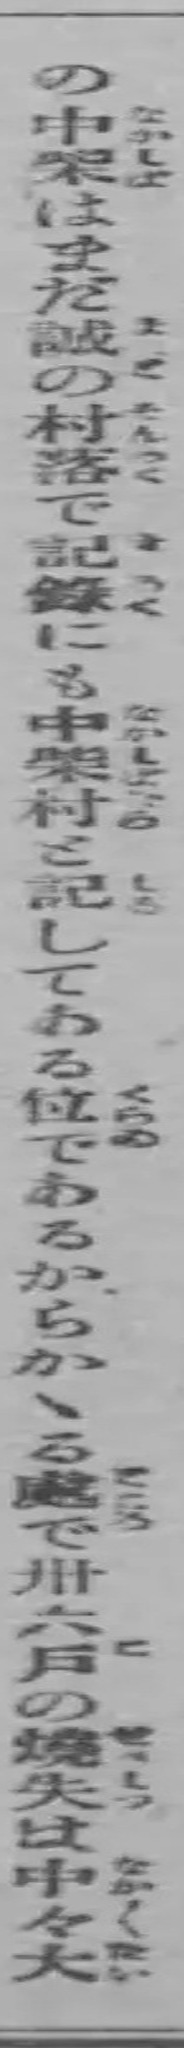の中柴はまだ誠の村落で記録にも中柴村と記してある位であるからかゝる処で卅六戸の焼失は中々大
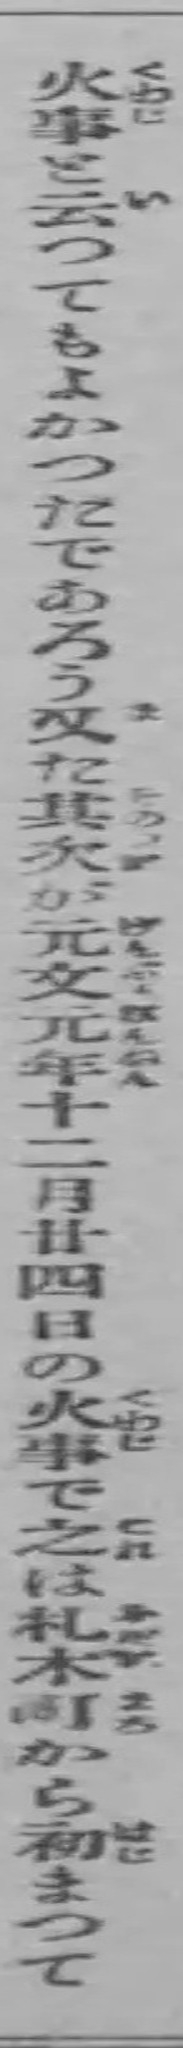火事と云つてもよかつたであろう又た其次が元文元年十二月廿四日の火事で之は札木町から初まつて
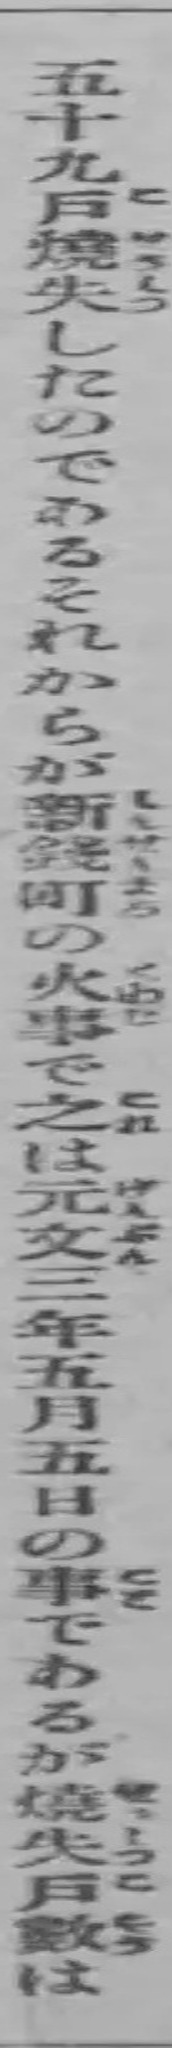五十九戸焼失したのであるそれからが新銭町の火事で之は元文三年五月五日の事であるが焼失戸数は
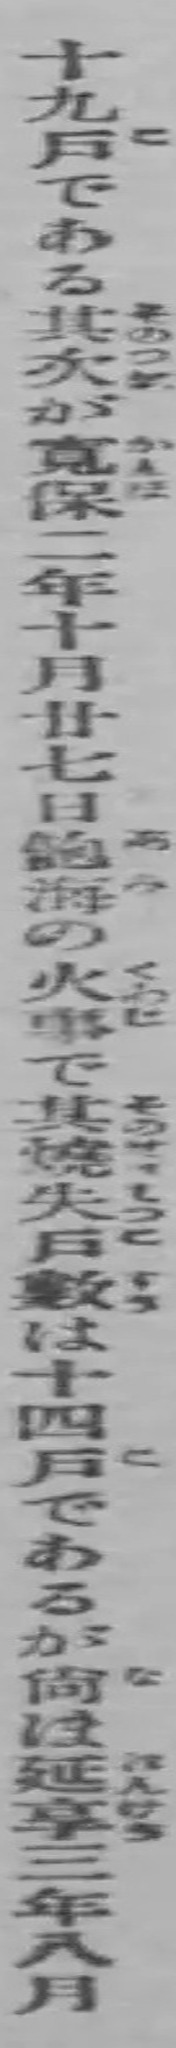十九戸である其次が寛保二年十月廿七日飽海の火事で其焼失戸数は十四戸であるが尚ほ延享三年八月
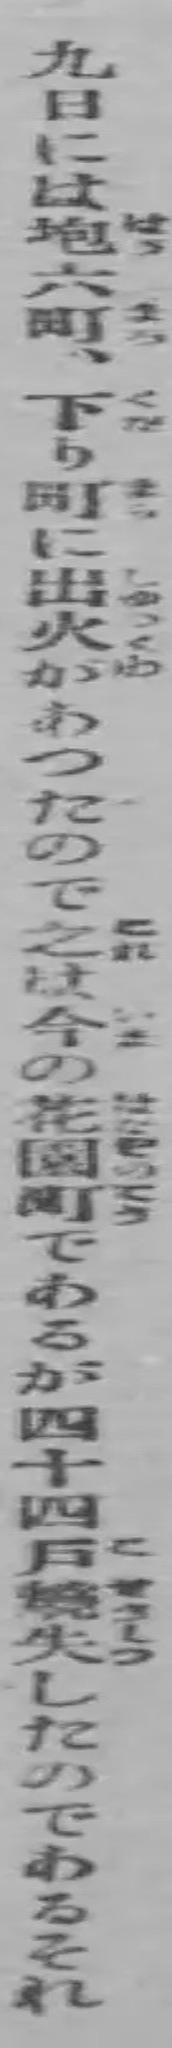九日には垉六町、下り町に出火があつたので之は今の花園町であるが四十四戸焼失したのであるそれ
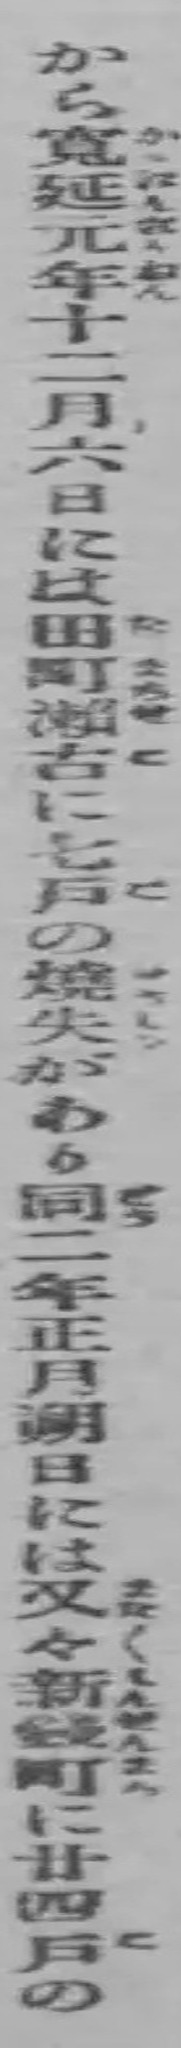から寛延元年十二月六日には田町瀬古に七戸の焼失があり同二年正月朔日には又々新銭町に廿四戸の
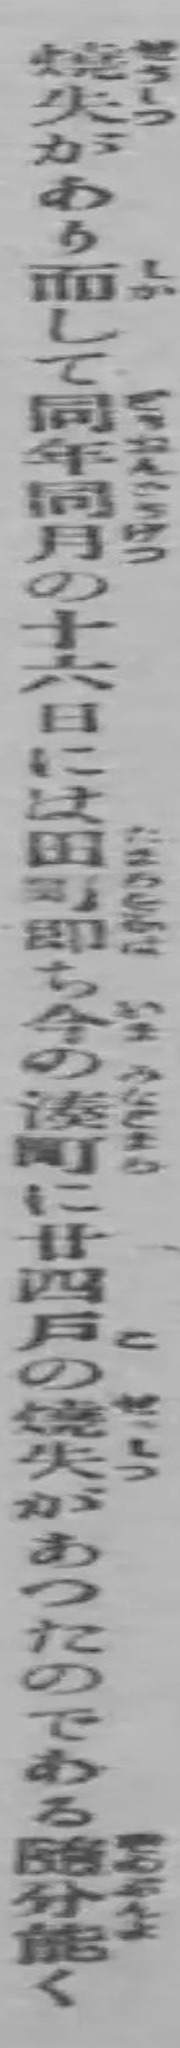焼失があり而して同年同月の十六日には田町即ち今の湊町に廿四戸の焼失があつたのである随分能く
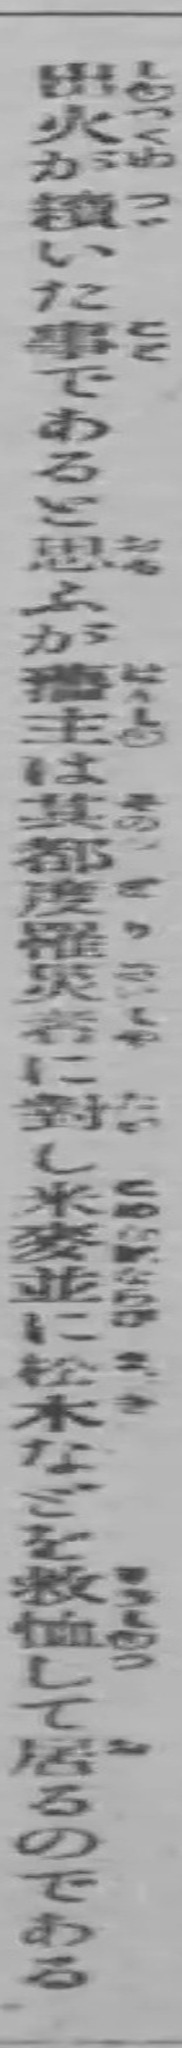出火が続いた事であると思ふが藩主は其都度罹災者に対して米麦並に松木などを救恤して居るのである
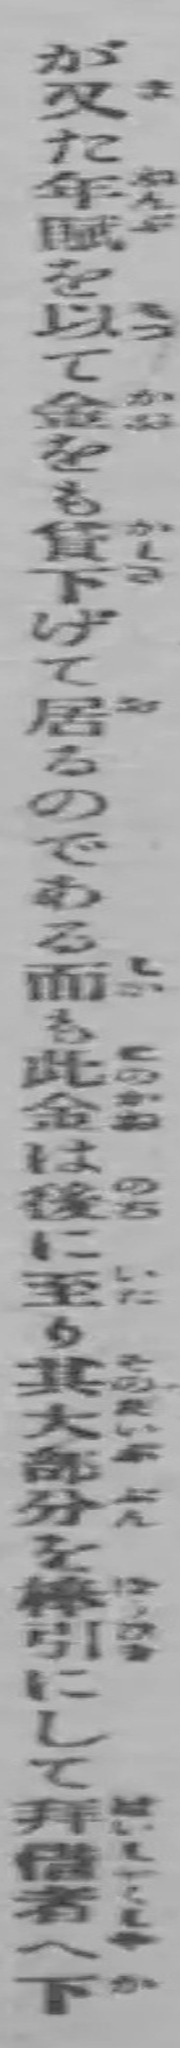が又た年賦を以て金をも貸下げて居るのである而も此金は後に至り其大部分を棒引にして拝借者へ下
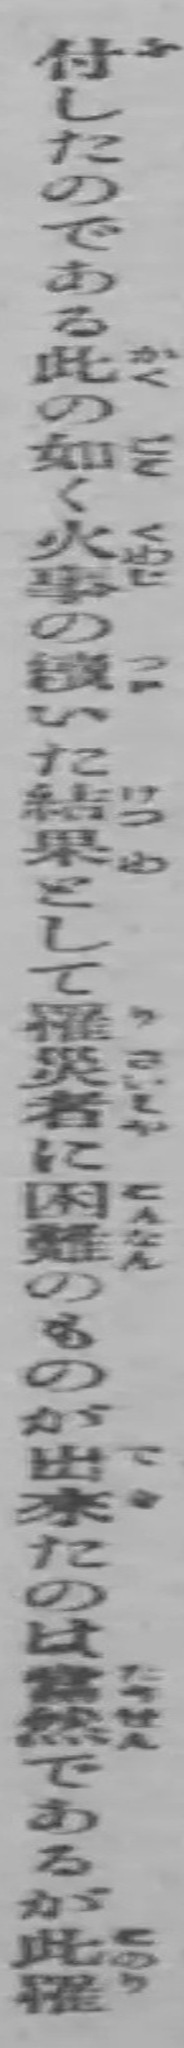付したのである此の如く火事の続いた結果として罹災者に困難のものが出来たのは当然であるが此罹
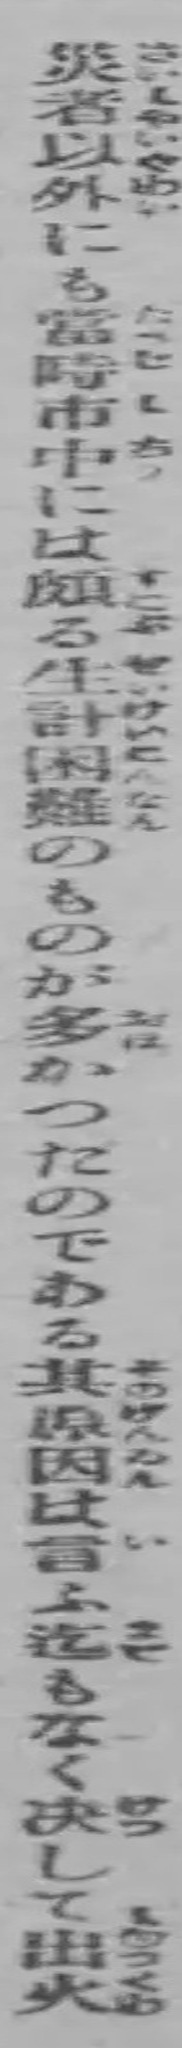市民の困弊災者以外にも当時市中には頗る生計困難のものが多かつたのである其原因は言ふ迄もなく決して出火
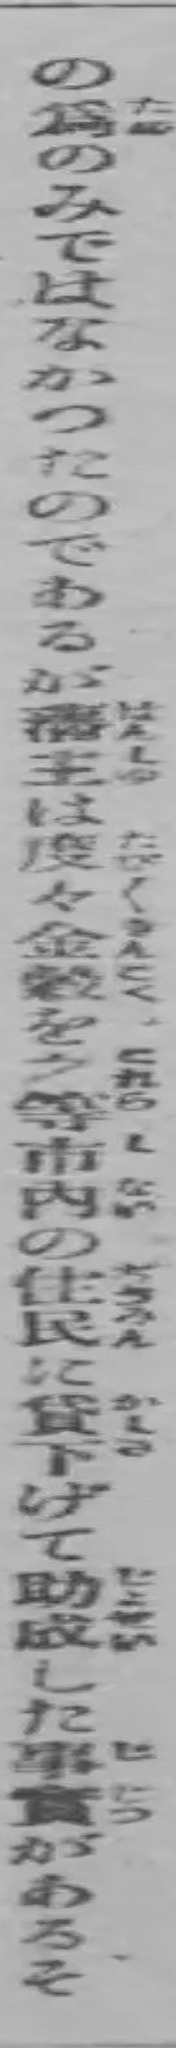の為のみではなかつたのであるが藩主は度々金穀を之等市内の住民に貸下げて助成した事実があるそ
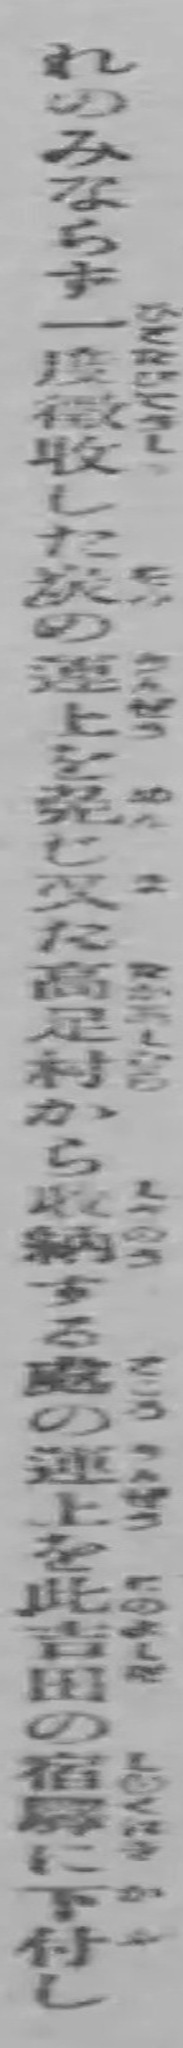れのみならず一度徴収した炭の運上を免じ又た高足村から収納する処の運上を此吉田の宿駅に下付し
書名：豊橋市史談
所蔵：国立国会図書館 National Diet Library, JAPAN
